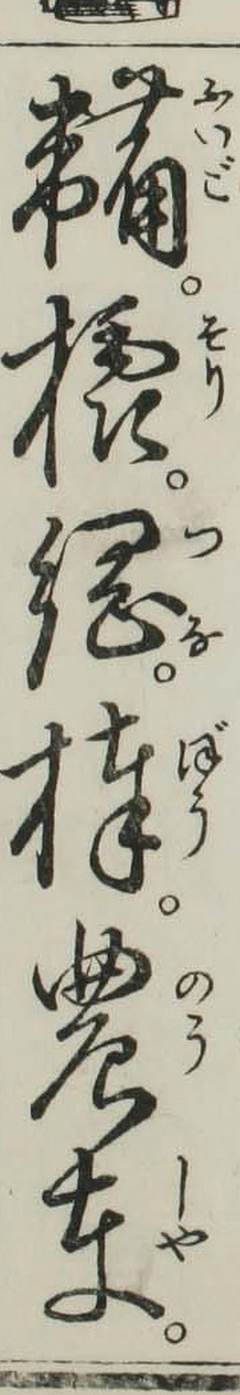鞴。橇。綱。棒。農車。

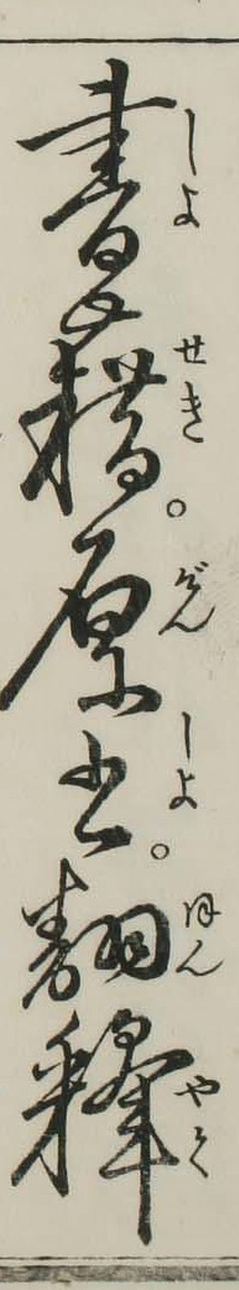書籍。原書。翻訳
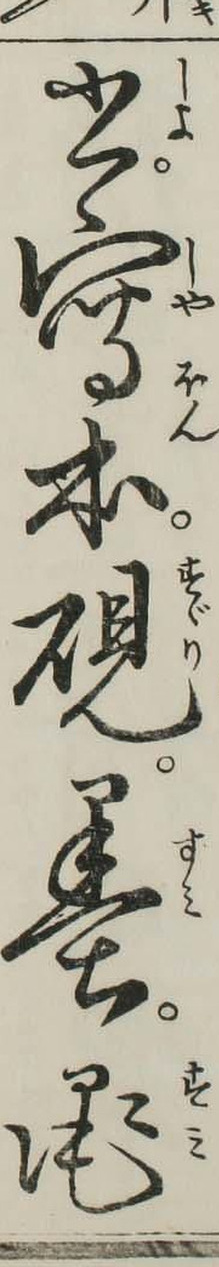書。写本。硯。墨。墨
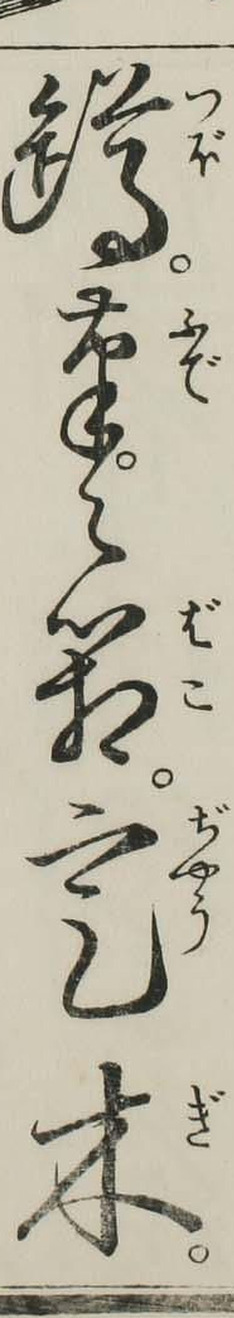罇。筆。々箱。定木。
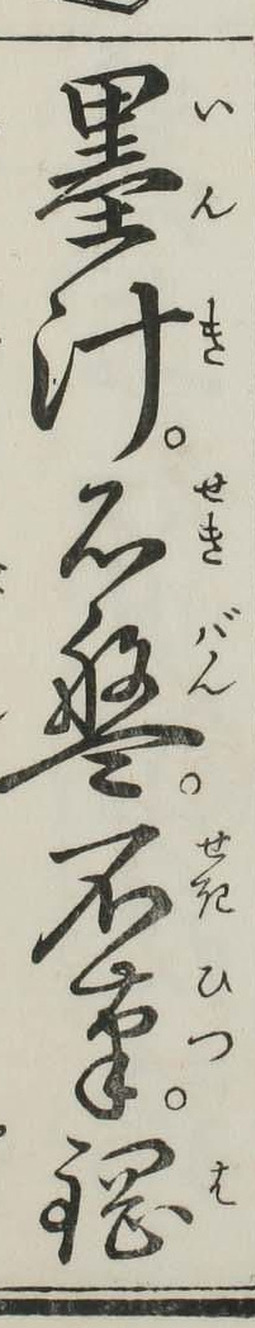墨汁。石盤。石筆。鋼
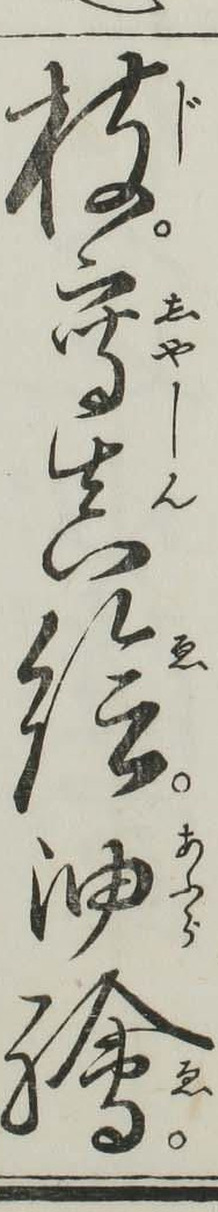枝。写真絵。油絵。
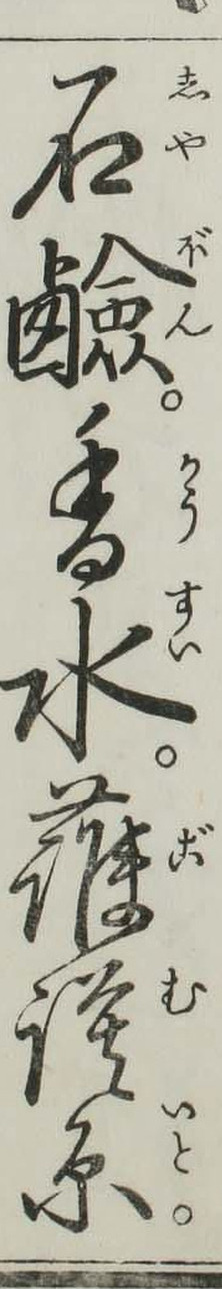石鹸。香水。護謨糸。
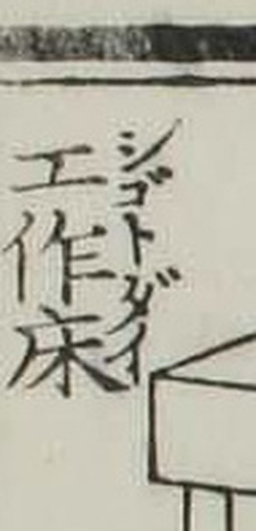工作床
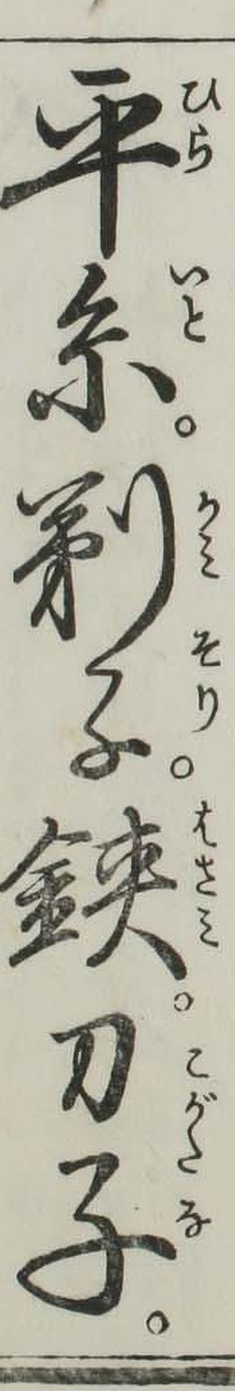平糸。剃子。鋏。刀子。

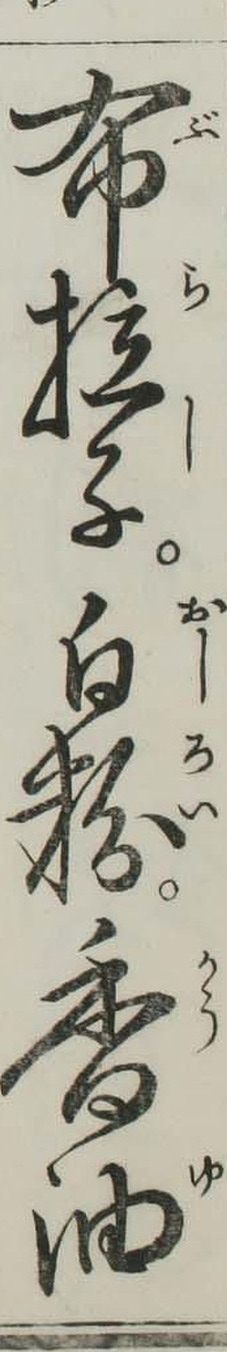布拉子。白粉。香油
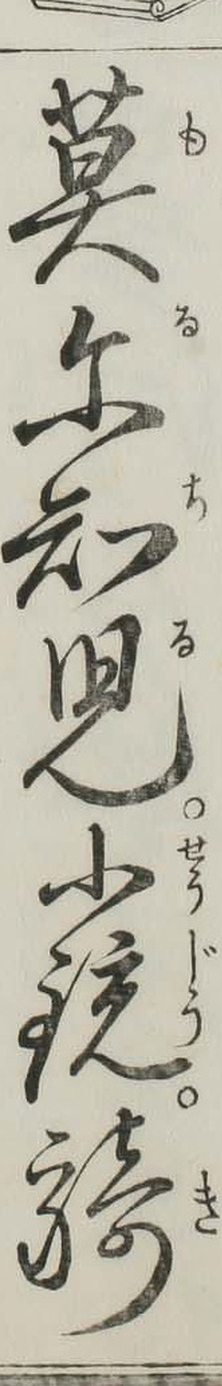莫尓知児。小銃。騎
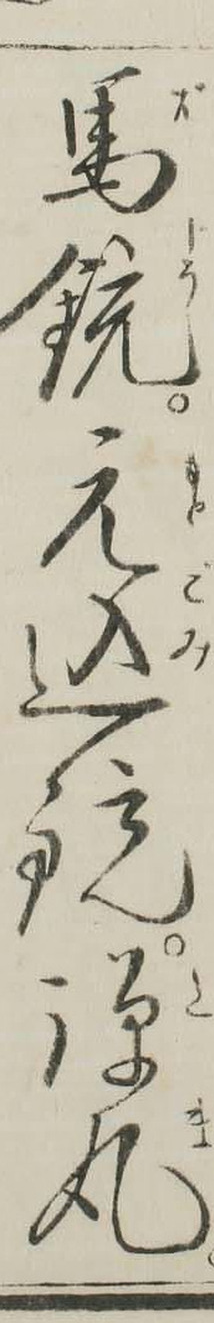馬銃。元込銃。弾丸。
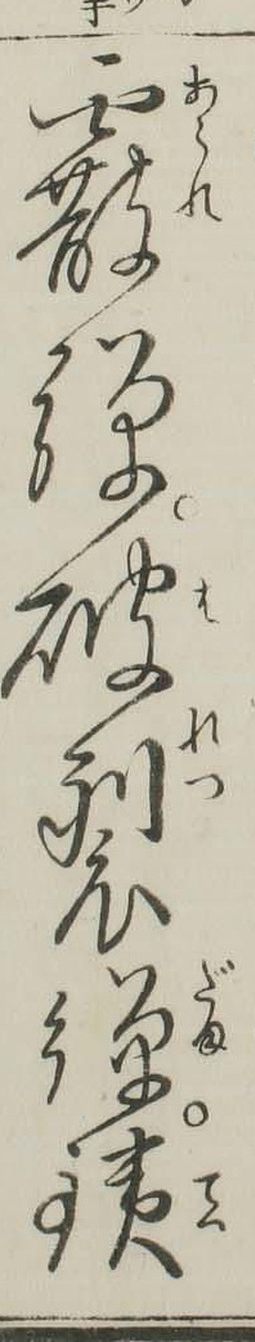霰弾。破裂弾。鉄
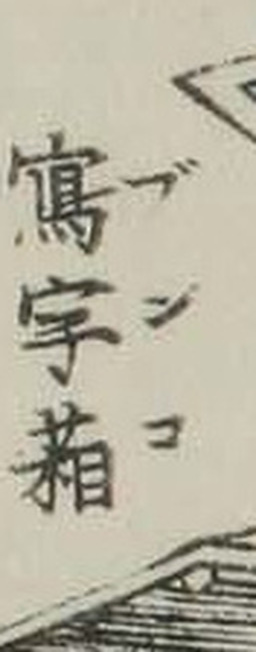写字箱

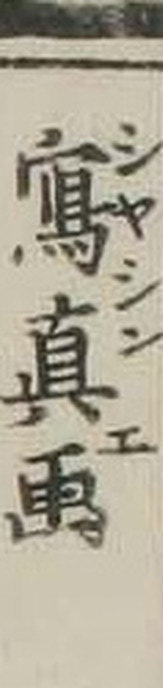写真画
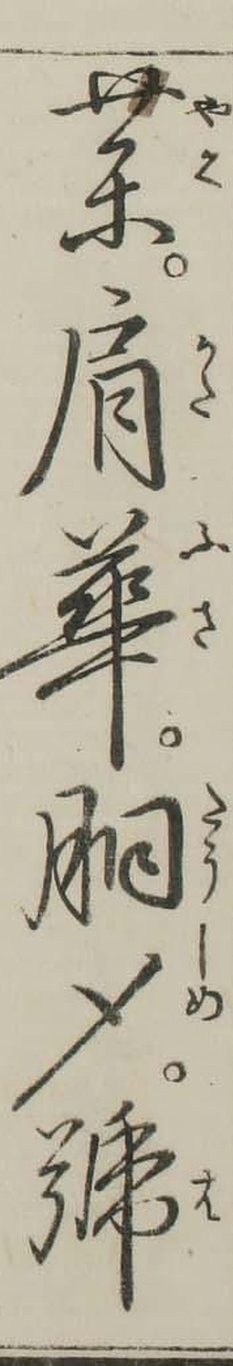薬。肩華。胴〆。号
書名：開化往来
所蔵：東京学芸大学教育コンテンツアーカイブ
